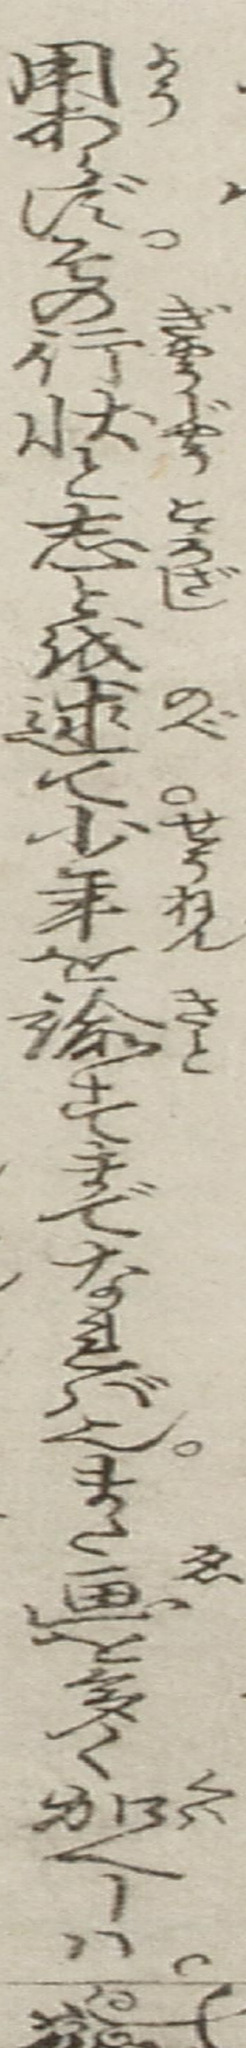用あらず。その行状と志とを述て。少年を諭すまでなれば也。また画を多く加へしは。
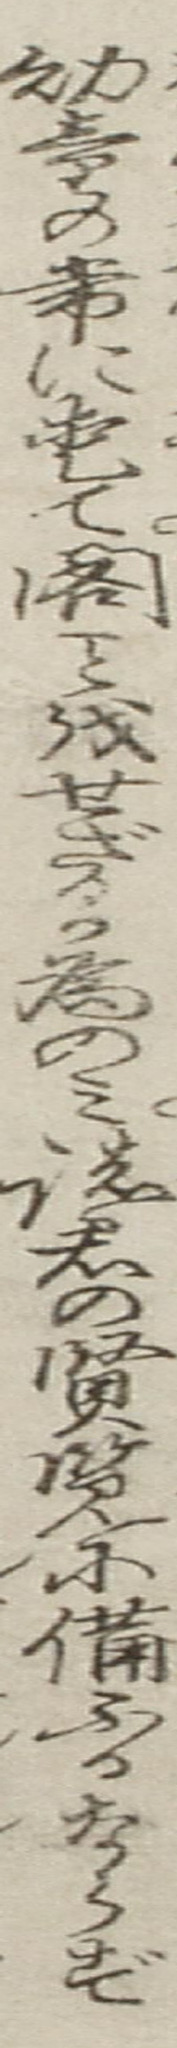幼童の常に愛て。閣ことをせざるか為のみ。諸君の賢覧に備ふるならず
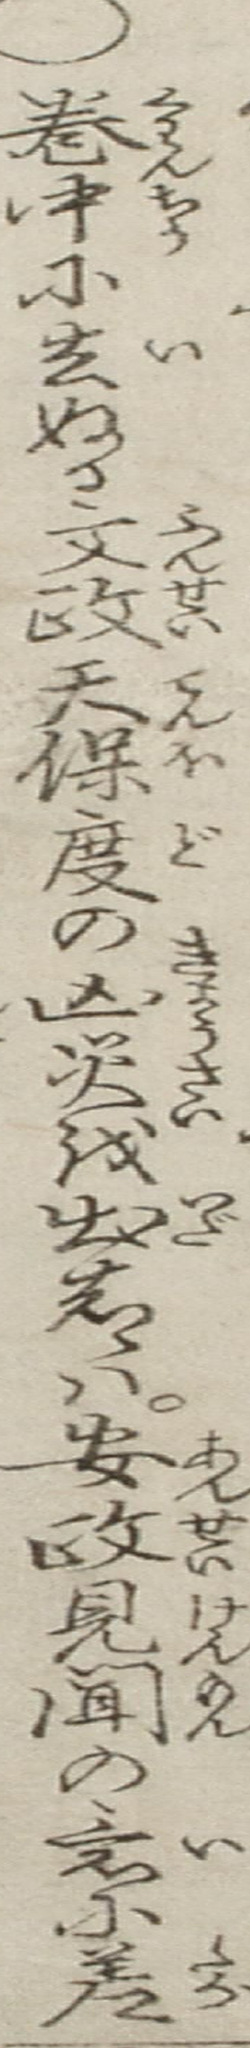○巻中に去ぬる文政天保度の凶災を出しゝは。安政見聞の意に差
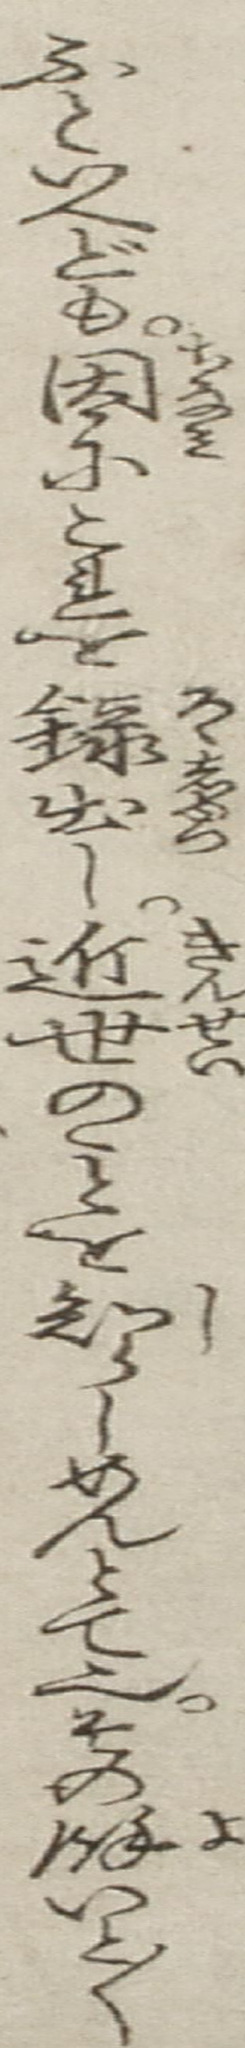ふといへども。因にこれを録出し。近世のことを知らしめんとて也。その餘いと〳〵
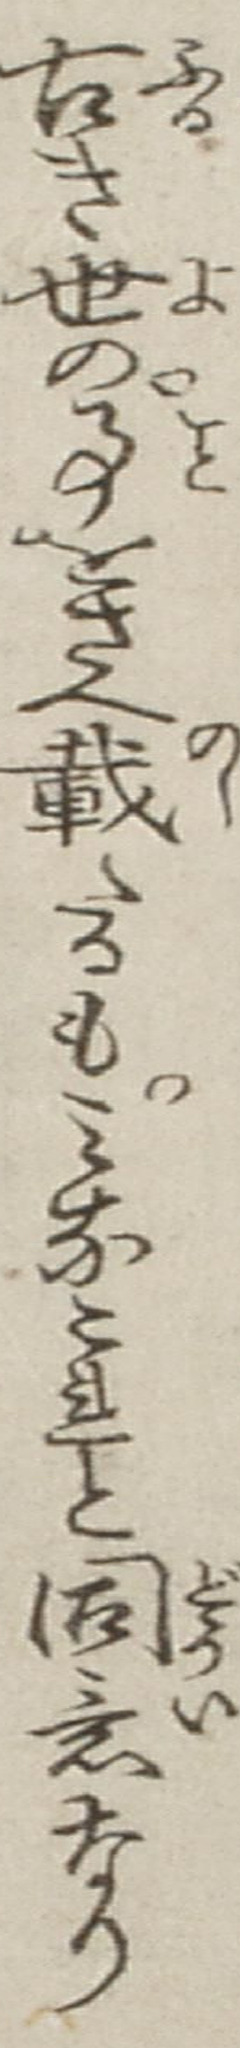古き世の。事をさへ載たるも。みなこれと同意なり
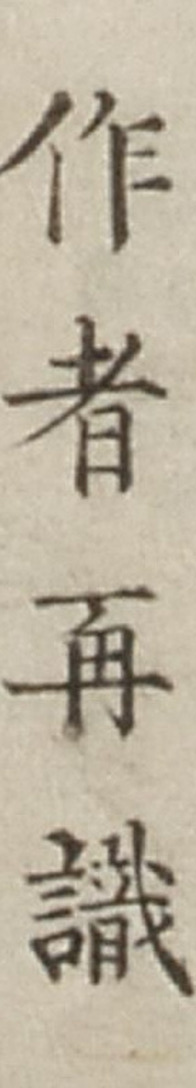作者再識
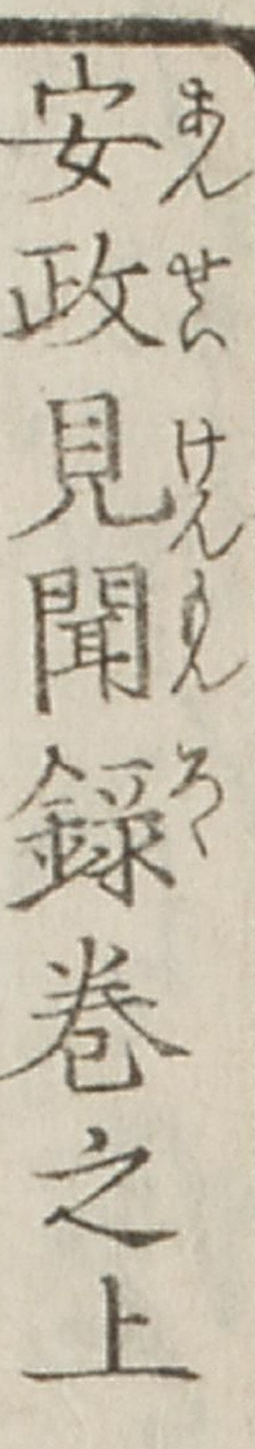安政見聞録巻之上
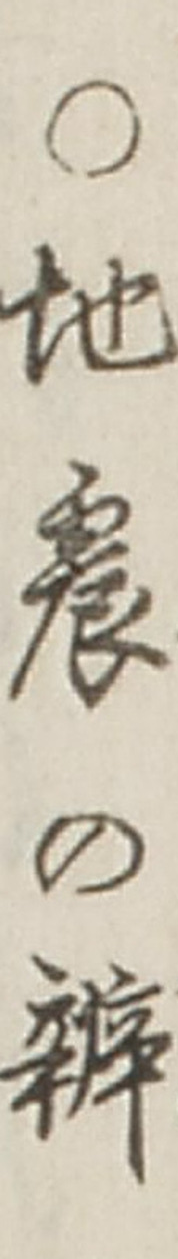○地震の弁
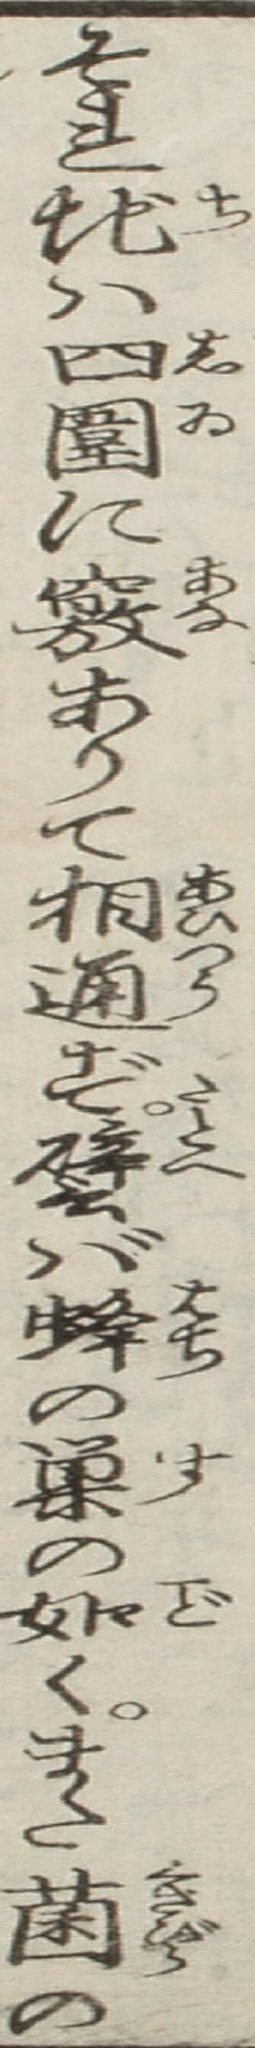それ地は四囲に穴ありて相通ず。譬ば蜂の巣の如く。また菌の
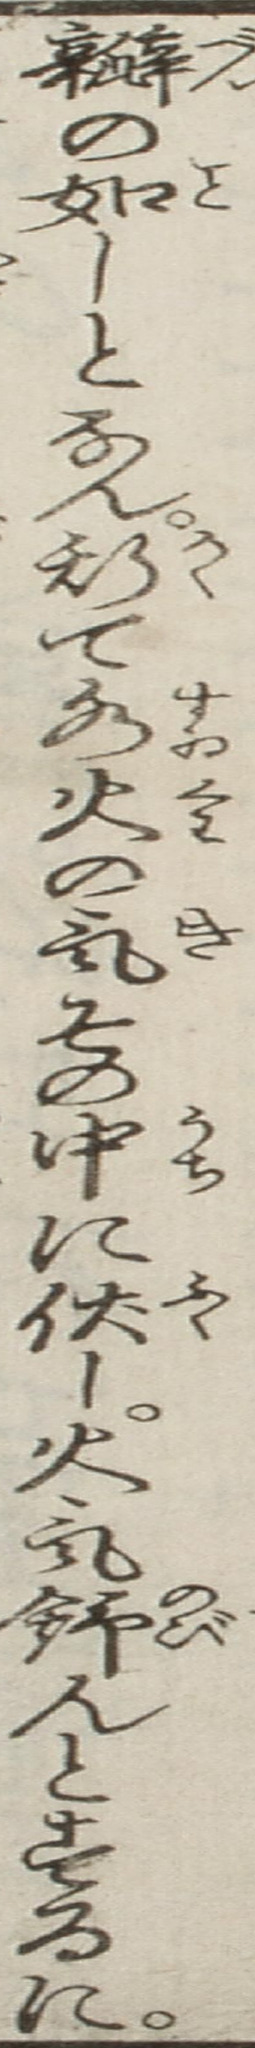弁の如しとなん。斯て水火の気その中に伏し。火気舒んとするに。
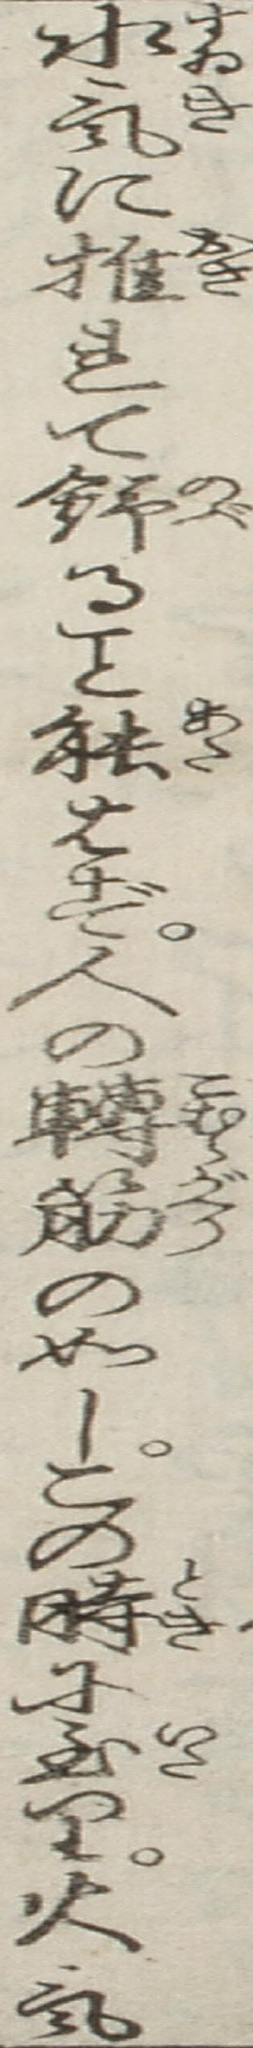水気に推れて舒ること能はず。人の転筋の如し。この時に至り。火気
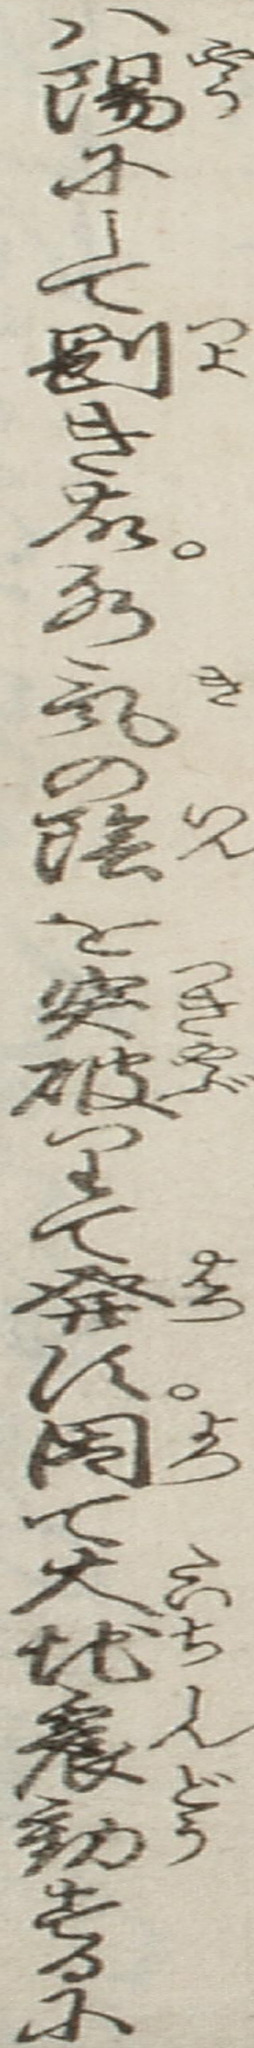は陽にして剛き故。水気の陰を突破りて発す。因て大地震動するに
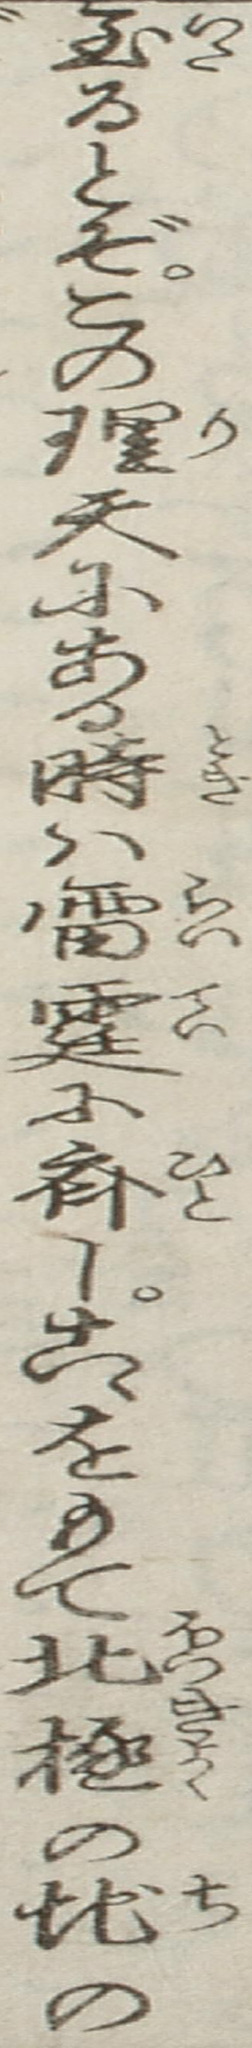至るとぞ。この理天にある時は雷霆に斉し。こをもて北極の地の
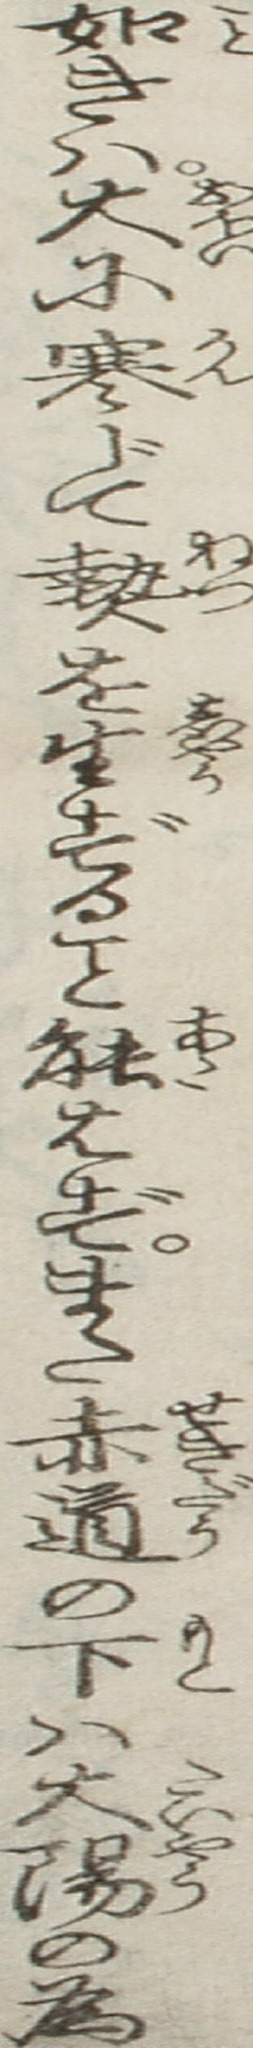如きは。大に寒じて熱を生ずること能はず。また赤道の下は大陽の為
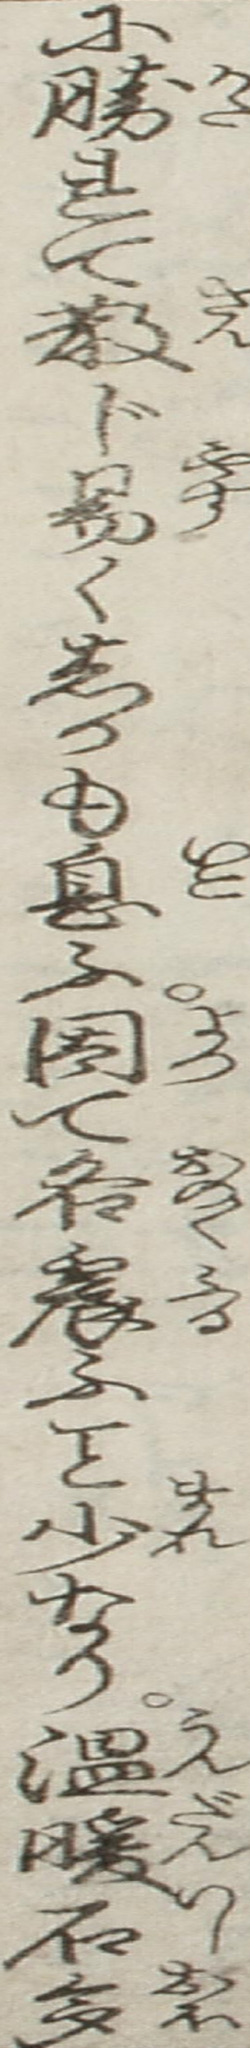に勝れて散じ易くしかも息ふ。因て各震ふこと少なり。温暖石多
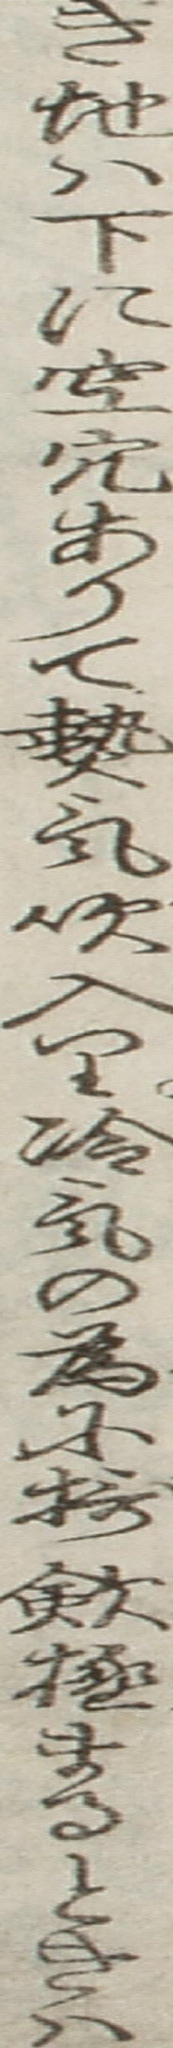き地は。下に空穴ありて熱気吹入り。冷気の為に接歛極まるときは
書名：安政見聞録　上
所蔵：東京大学地震研究所図書室 Earthquake Research Institute Library, The University of Tokyo, JAPAN
